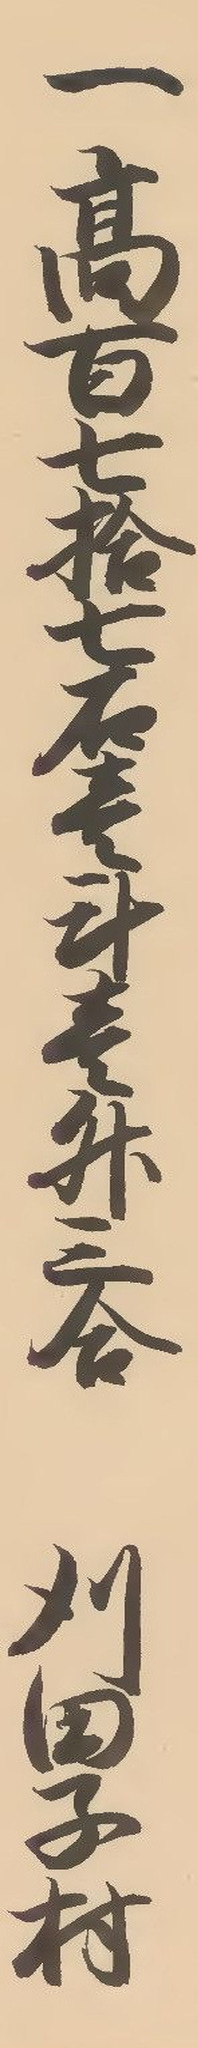一高百七拾七石壱斗壱升三合刈田子村

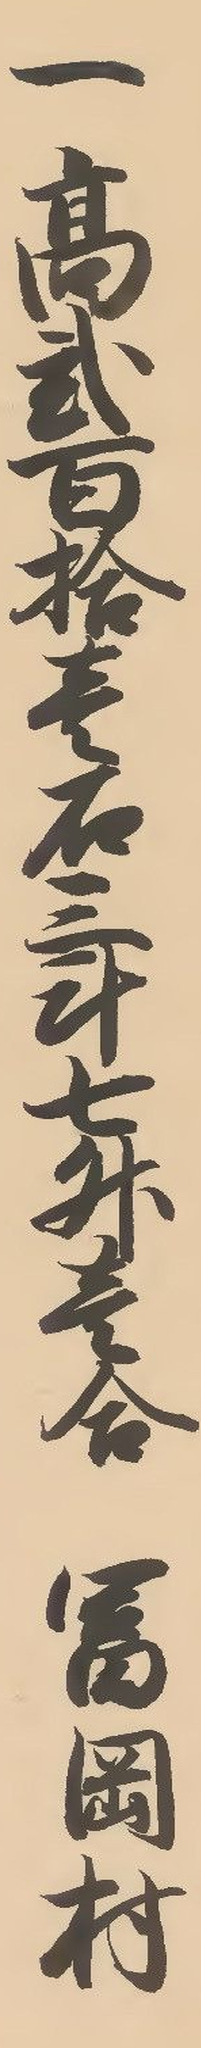一高弐百拾壱石三斗七升壱合富岡村
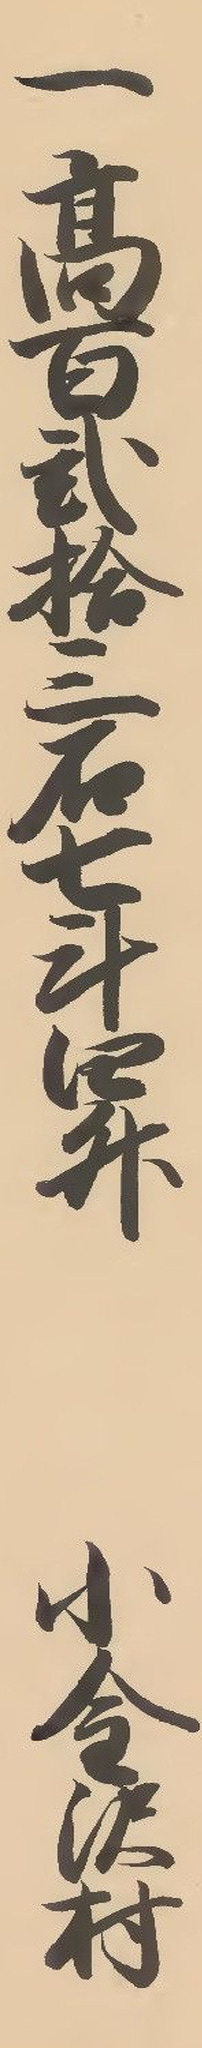一高百弐拾三石七斗四升小金沢村
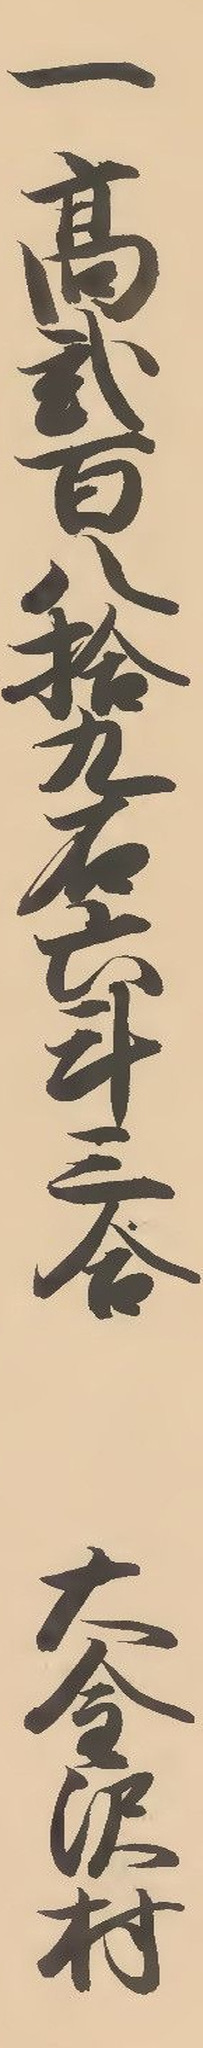一高弐百八拾九石六斗三合大金沢村
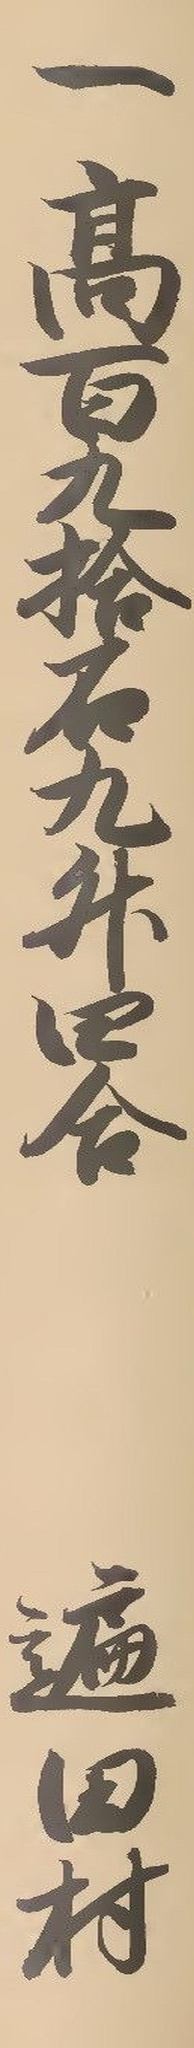一高百九拾石九升四合遍田村
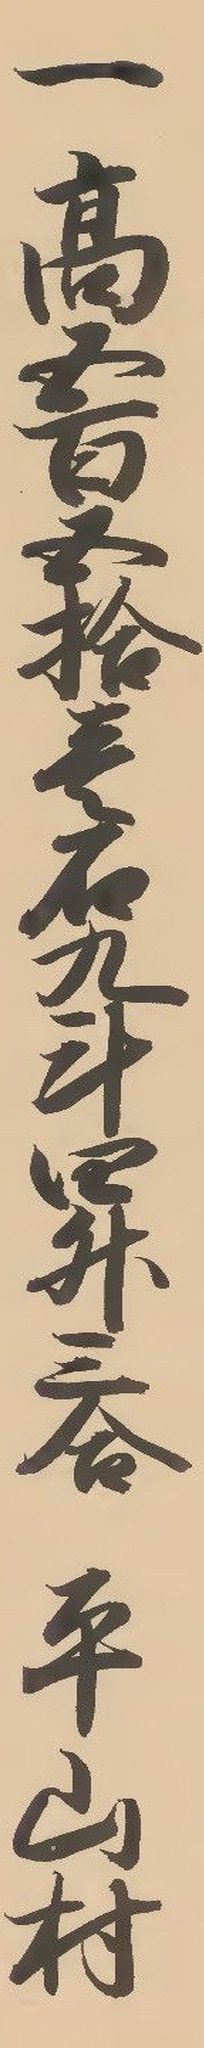一高五百五拾壱石九斗四升三合平山村
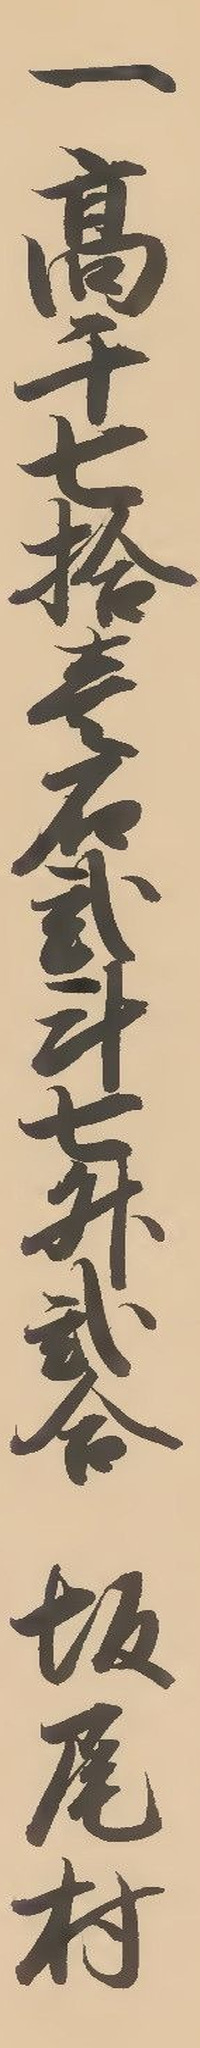一高千七拾壱石弐斗七升弐合坂尾村
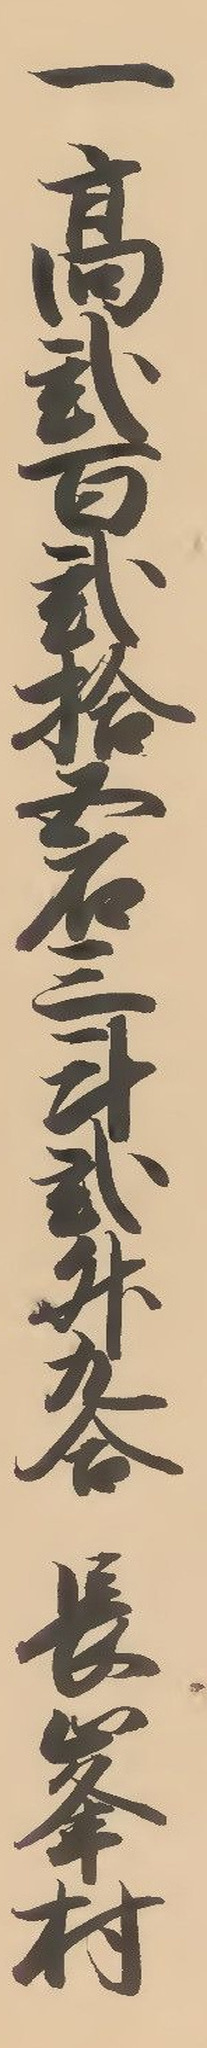一高弐百弐拾五石三斗弐升九合長峰村

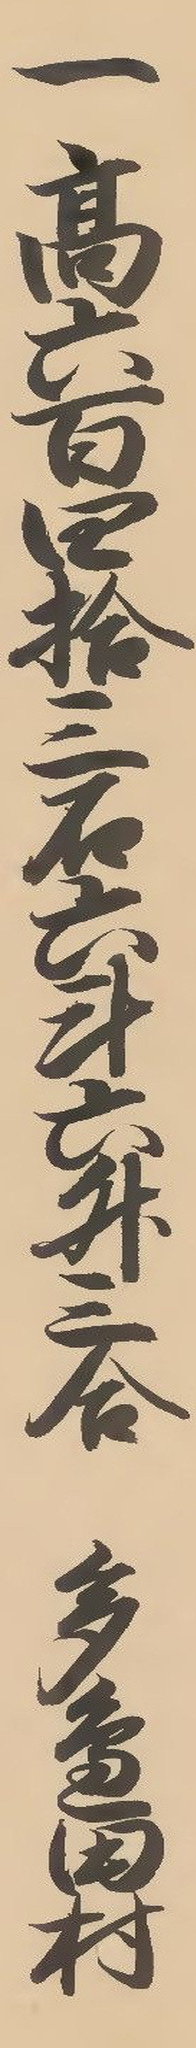一高六百四拾三石六斗六升三合多辺田村
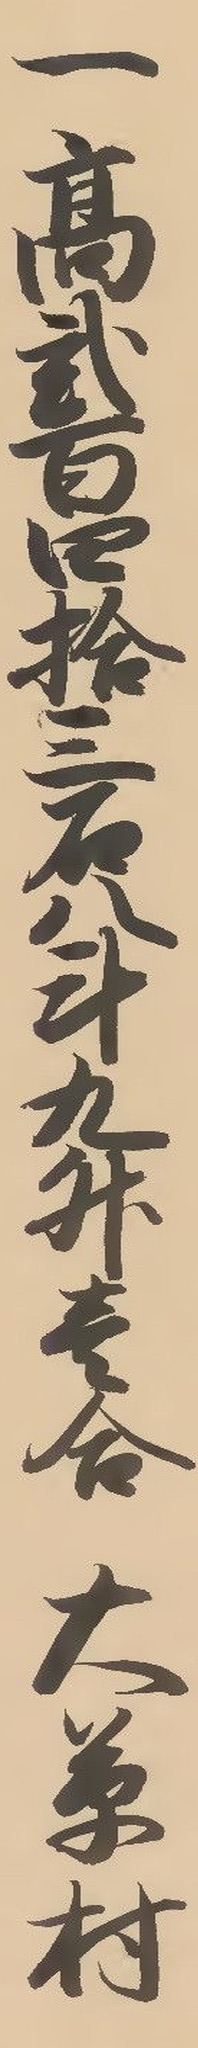一高弐百四拾三石八斗九升壱合大草村
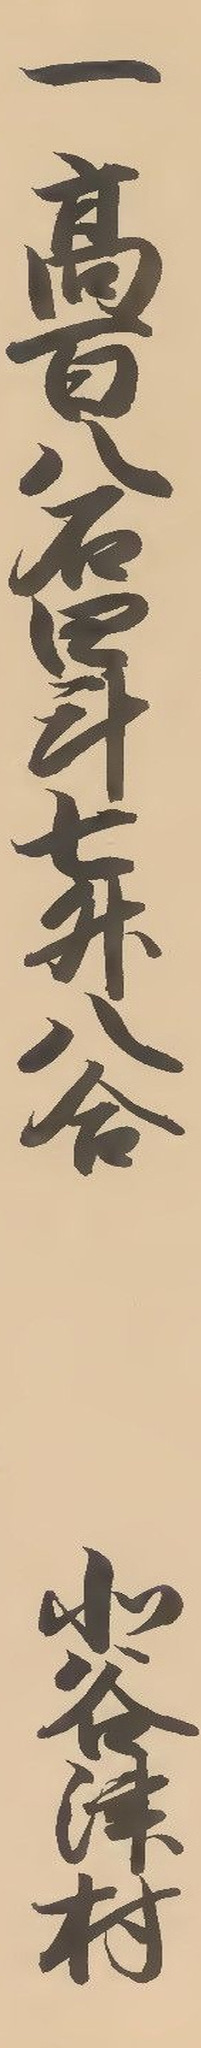一高百八石四斗七升八合北谷津村
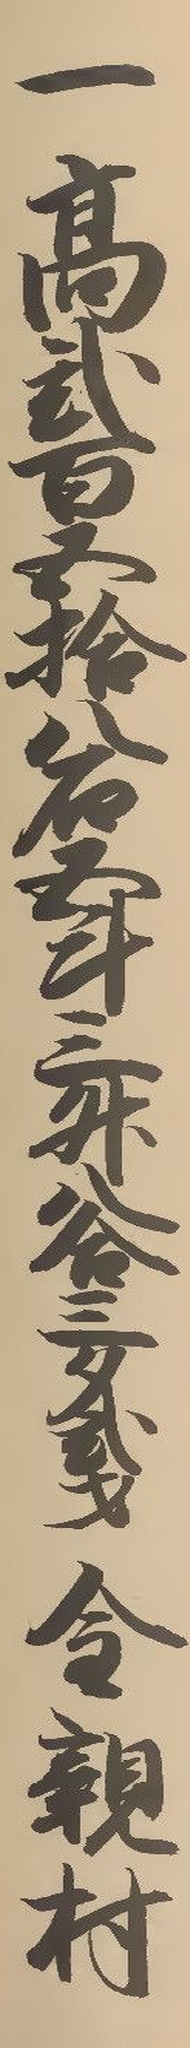一高弐百五拾八石五斗三升八合三勺弐才金親村
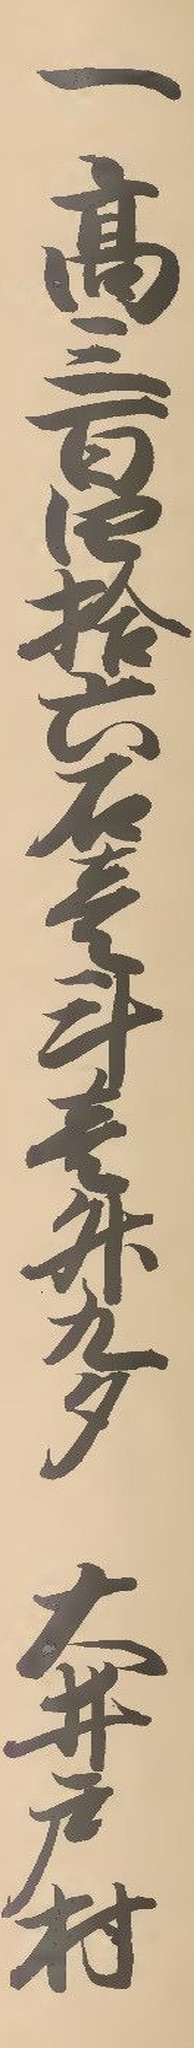一高三百四拾六石壱斗壱升九勺大井戸村
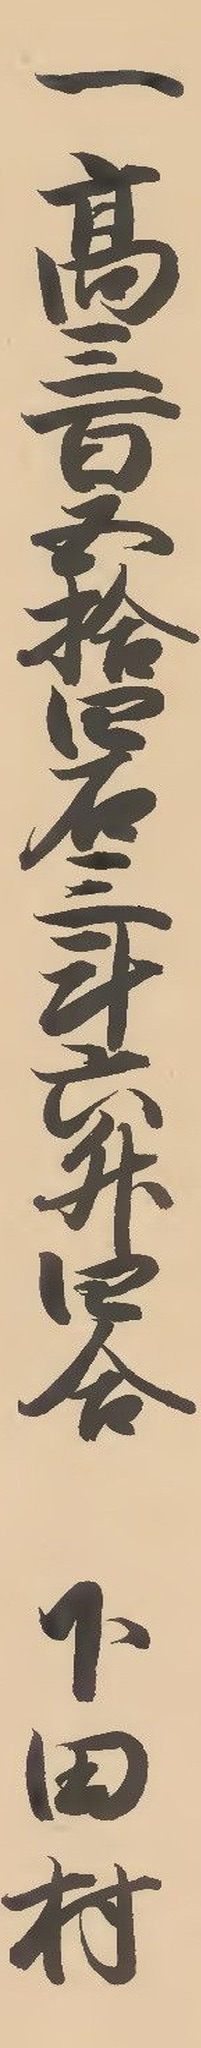一高三百五拾四石三斗六升四合下田村
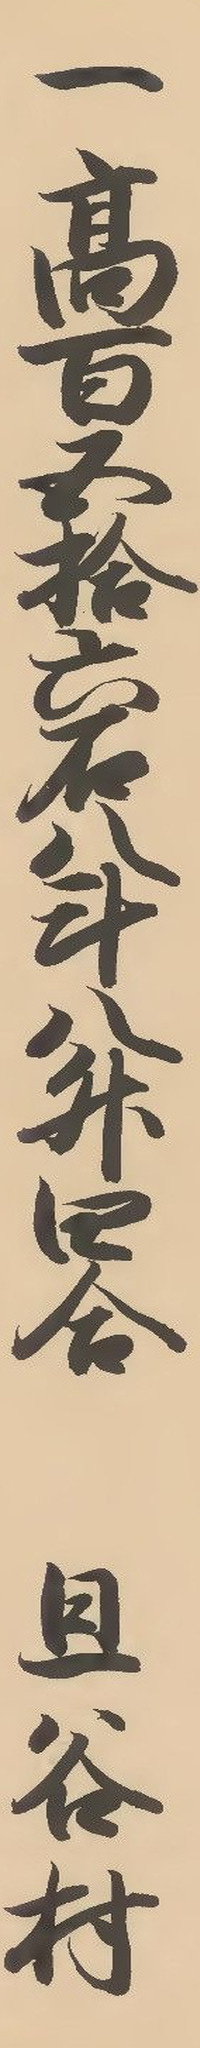一高百五拾六石八斗八升四合旦谷村
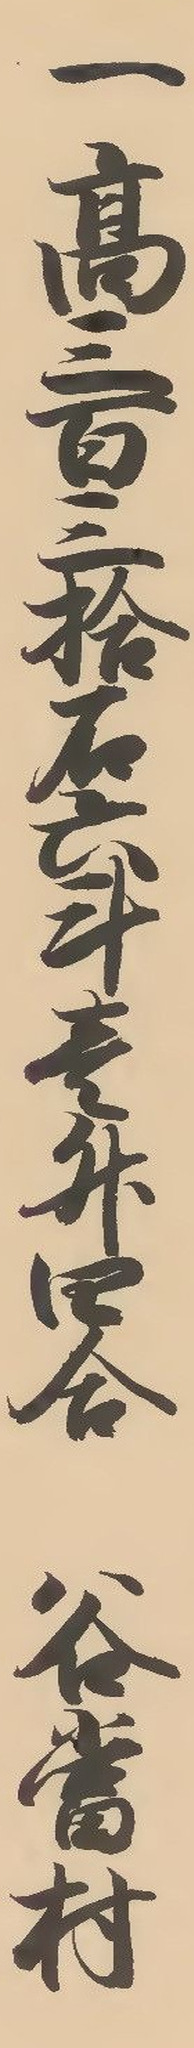一高三百三拾石六斗壱升四合谷当村
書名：下総国郷帳
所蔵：国立公文書館 National Archives of Japan
